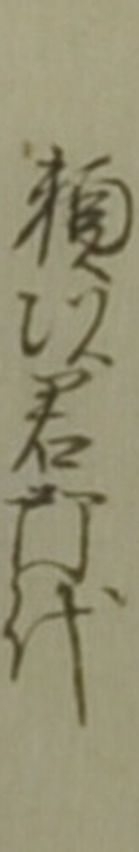頼以君御代
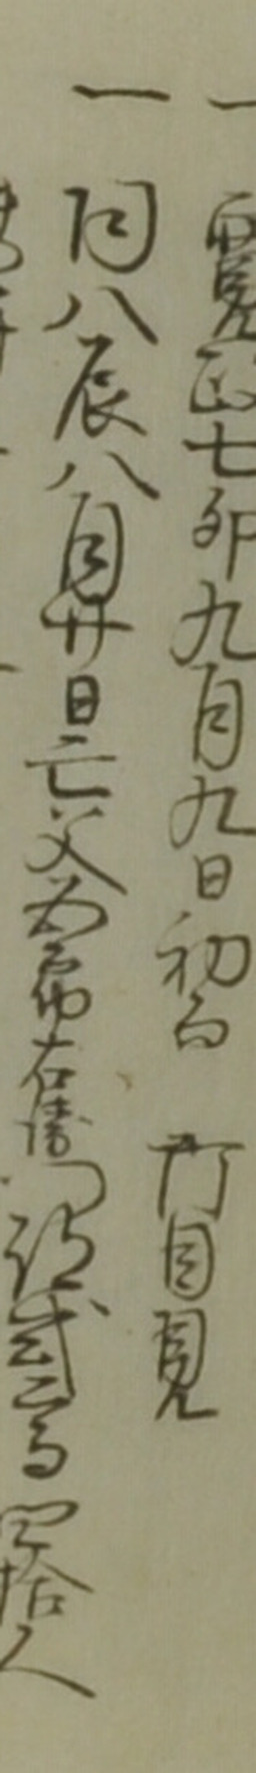一同八辰八月廿日亡父五郎右衛門跡式高四拾人
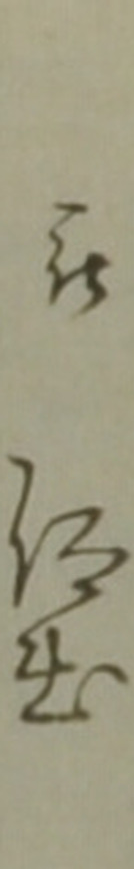被仰出
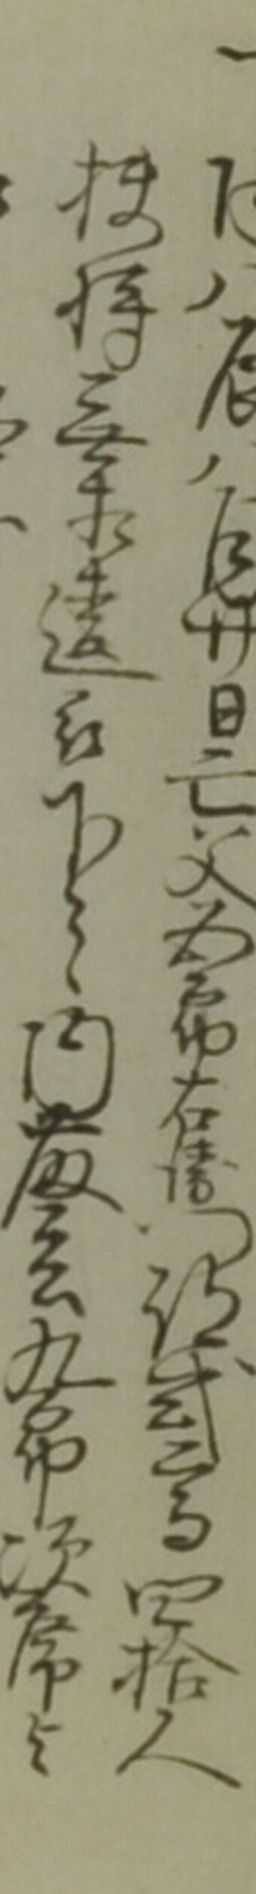扶持無相違被下之内藤玄九郎次席与
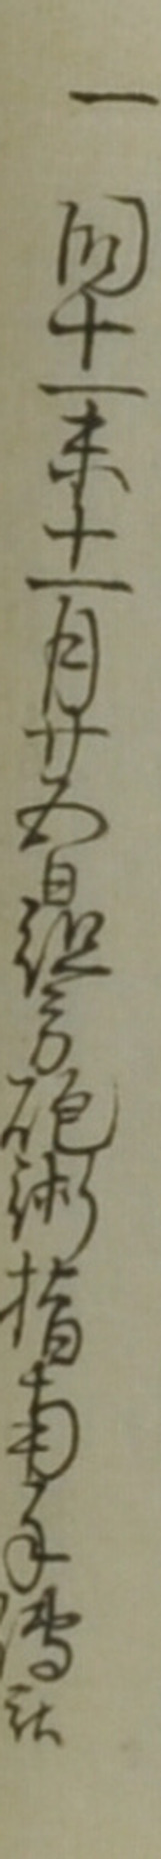一同十一未十一月廿五日組方砲術指南手伝被
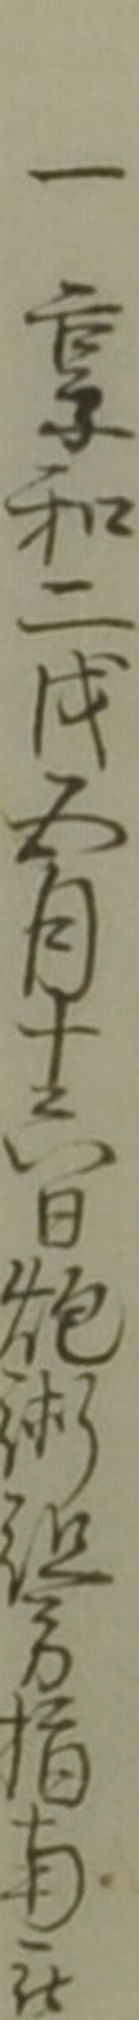一享和二戌五月十六日炮術組方指南被
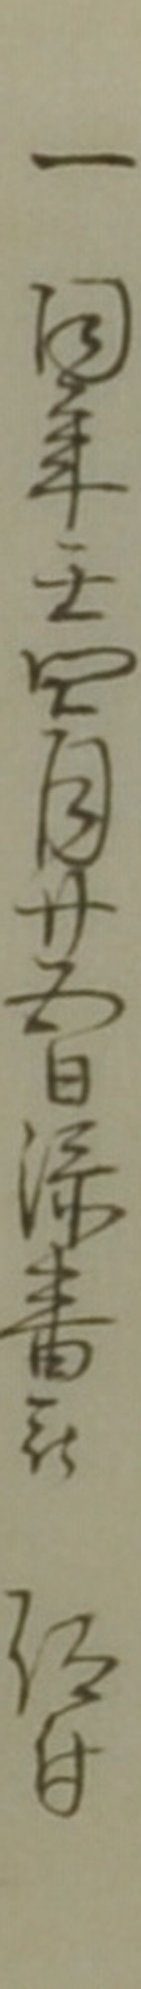一同年閏四月廿五日添番被仰付
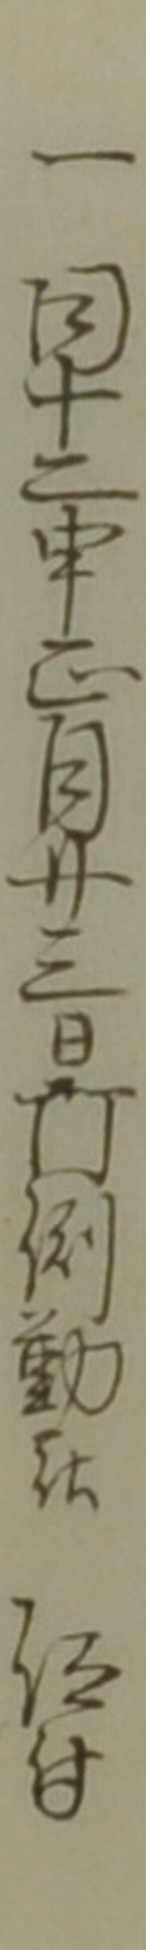一同十二申正月廿三日御側勤被仰付
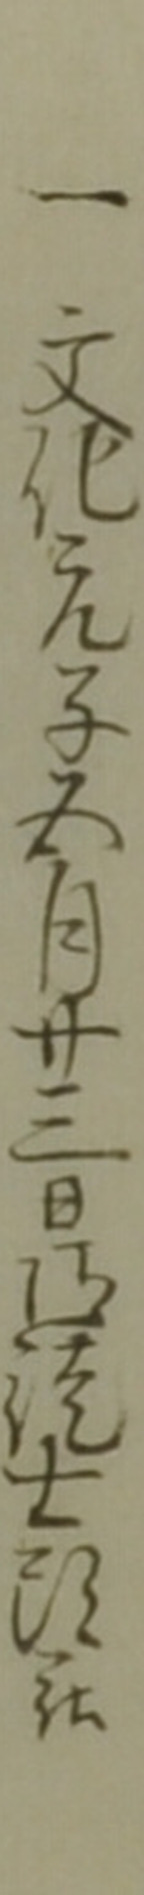一文化元子五月廿三日御徒士頭被
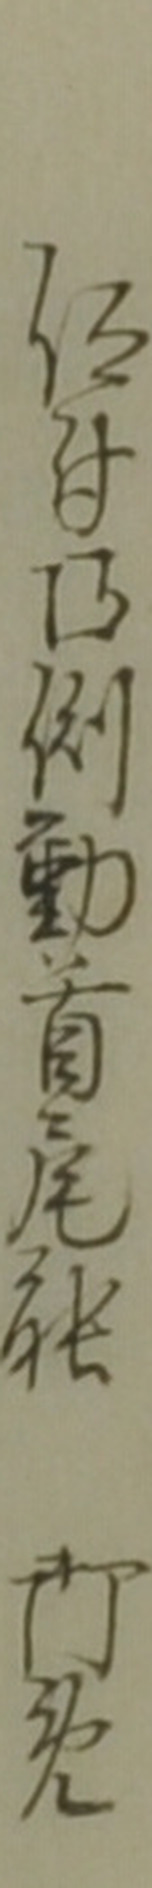仰付御側勤首尾能御免
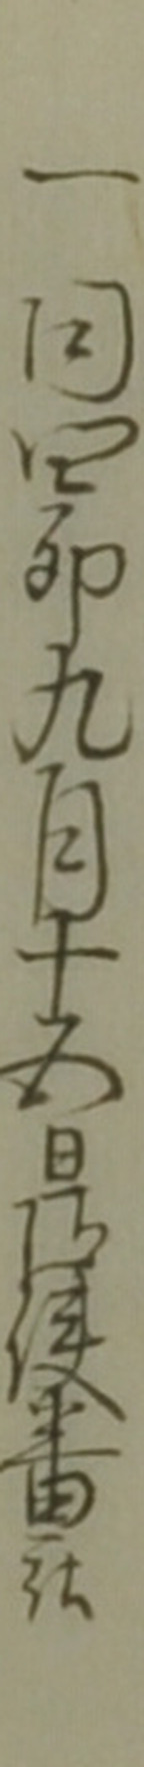一同四卯九月十五日御使番被
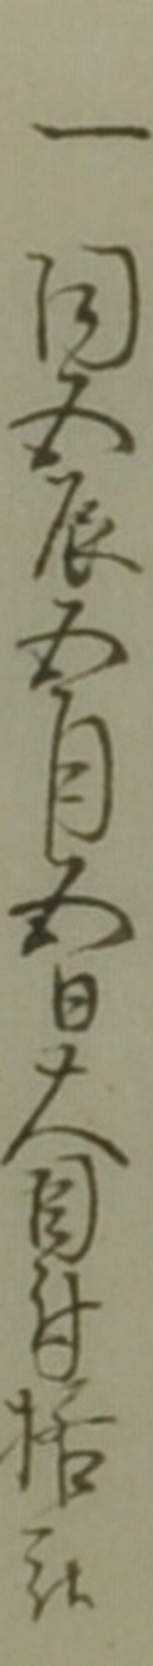一同五辰五月五日大目付格被
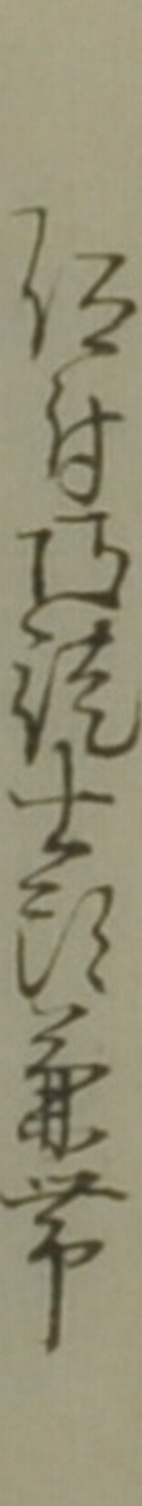仰付御徒士頭兼帯
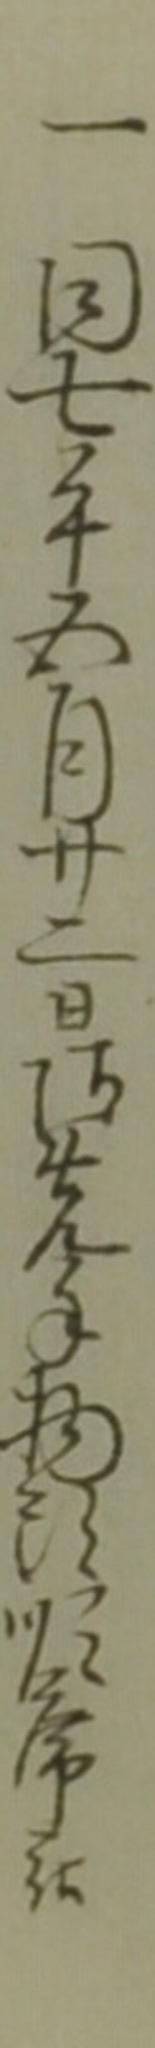一同七午五月廿二日御先手物頭順席被
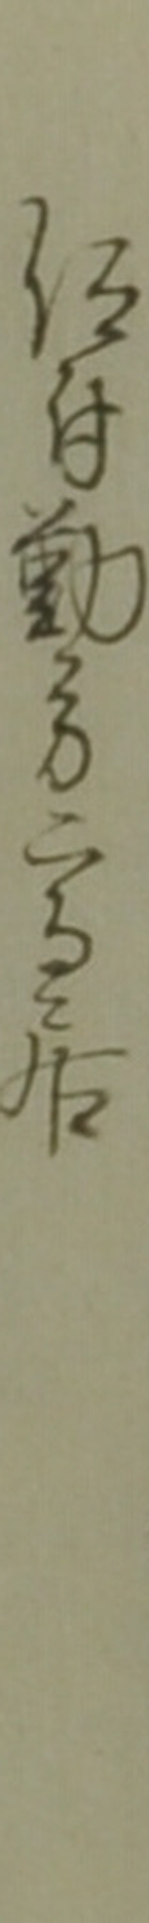仰付勤方高居
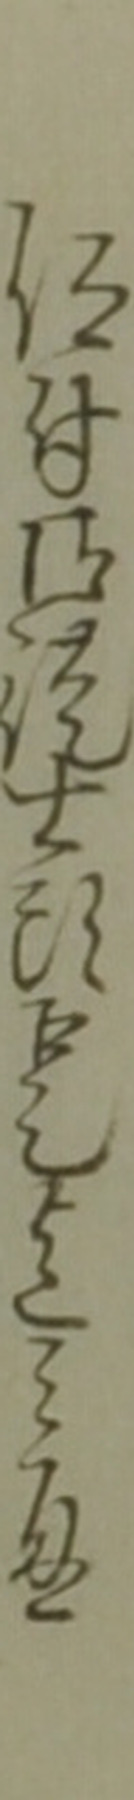仰付御徒士頭是迄之通
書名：給人諸士勤仕録（三）
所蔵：伊那市立高遠町図書館・合同会社AMANE
